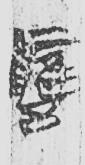{疒雍}
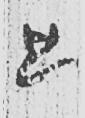也
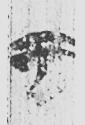于
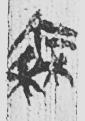秦
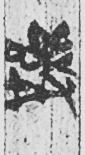襄
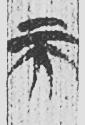而〈夫〉
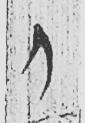人
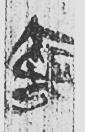{宀昏耳}
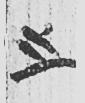之
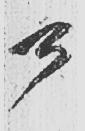乃
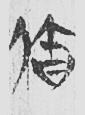{人缶}
